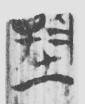{章欠土}
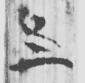之
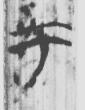于
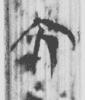大
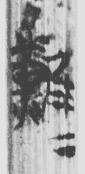難=
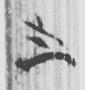之
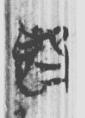既
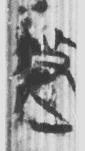﨤
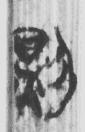則
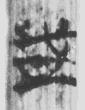或
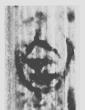自
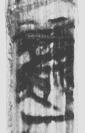{麗止}
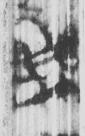𡚦
